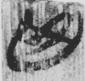臣
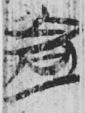者
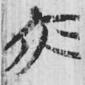亦
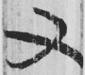又（有）
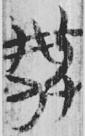○（爭）
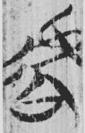○（乎）
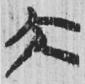大（太）
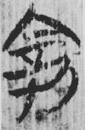○（宰）
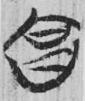○（答）
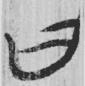曰
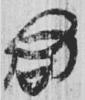君
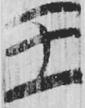王
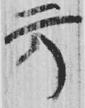元
